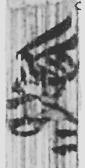旨頁=
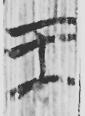王
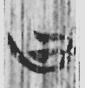曰
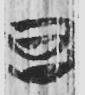旦
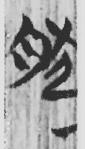肰
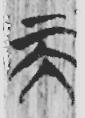天
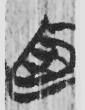廼
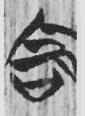命
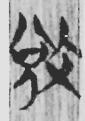敓（說）
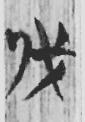伐
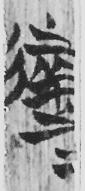{辶止㚔}（失）
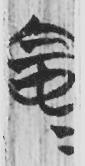{宀𠁩}（仲）
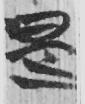是
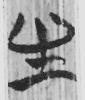生
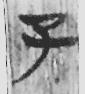子
